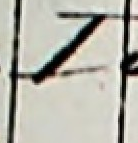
I
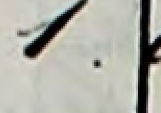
1
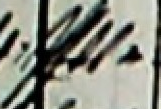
Pflds„
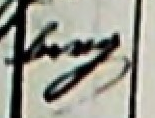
berg
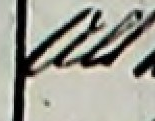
Alt
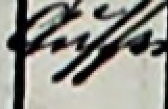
Aussee
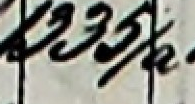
1335/a
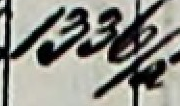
1336/a
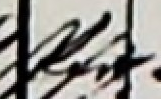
Pfds„
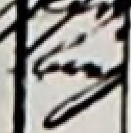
berg
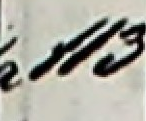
113
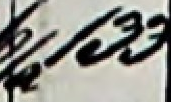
133
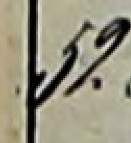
52
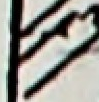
47
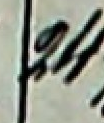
24
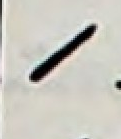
1
